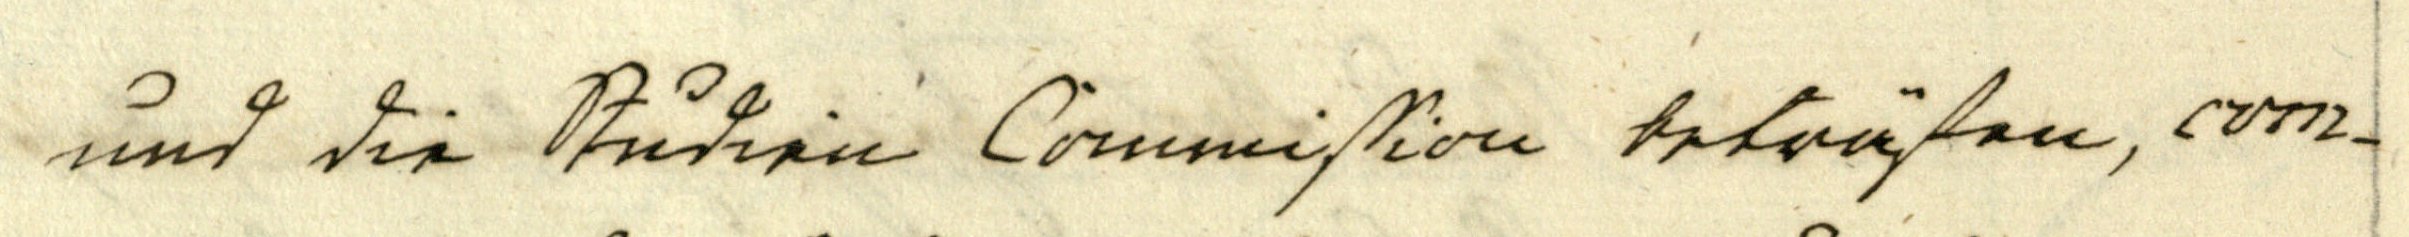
und die Studien Commission beträfen, com¬
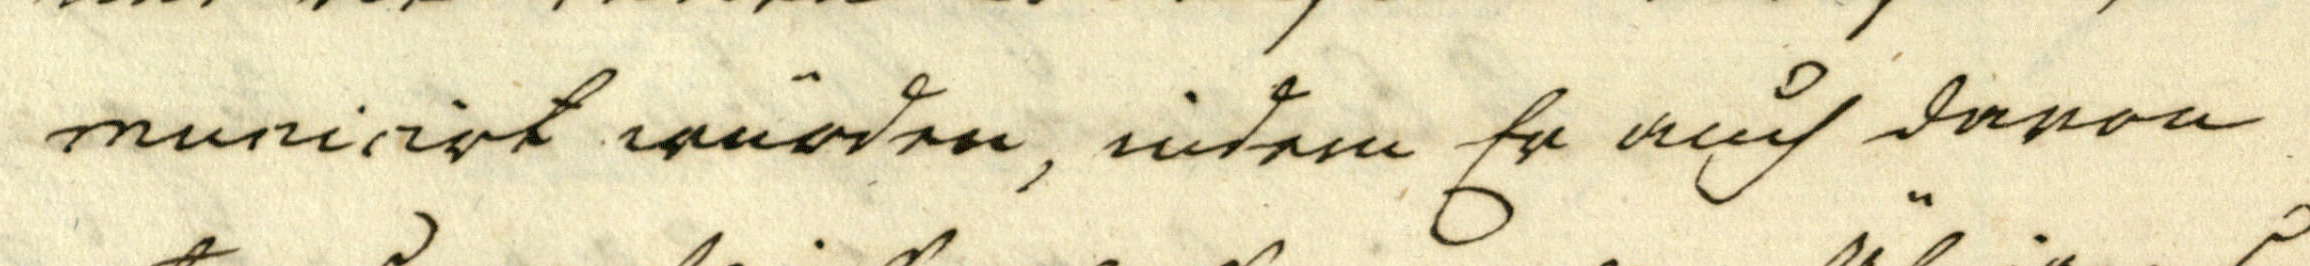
municirt würden, indem Er auch davon
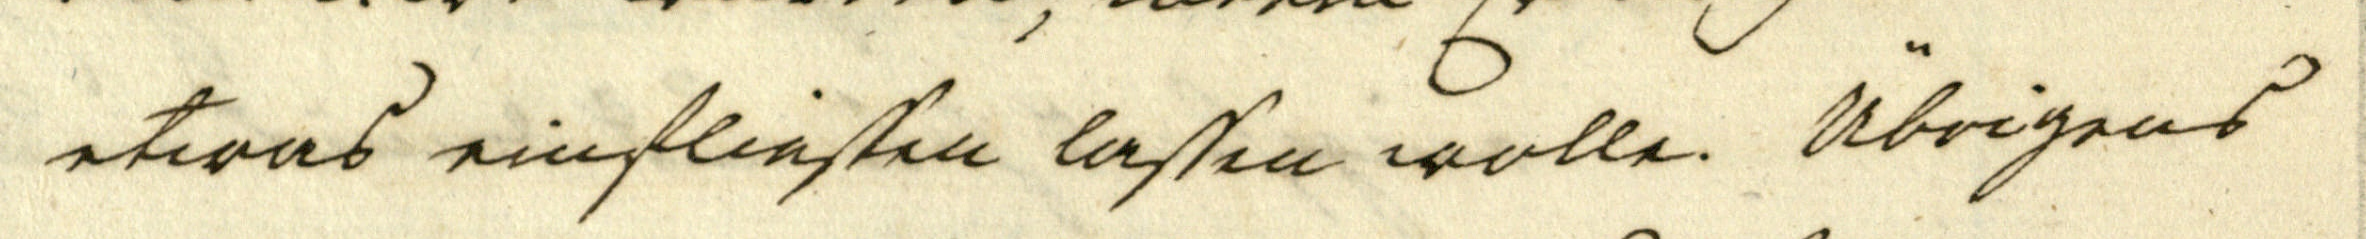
etwas einfliessen lassen wolle. Übrigens
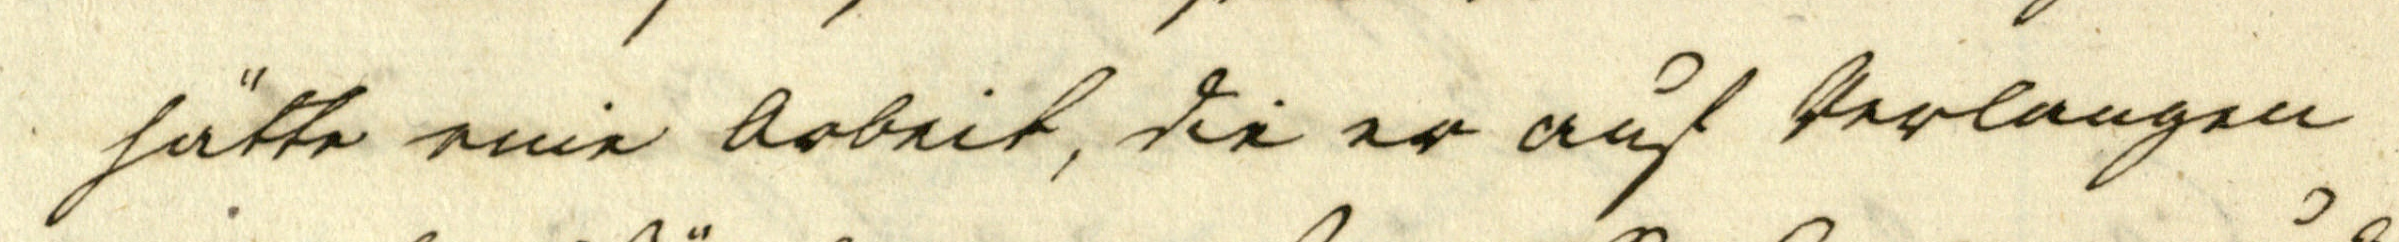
hätte eine Arbeit, die er auf Verlangen
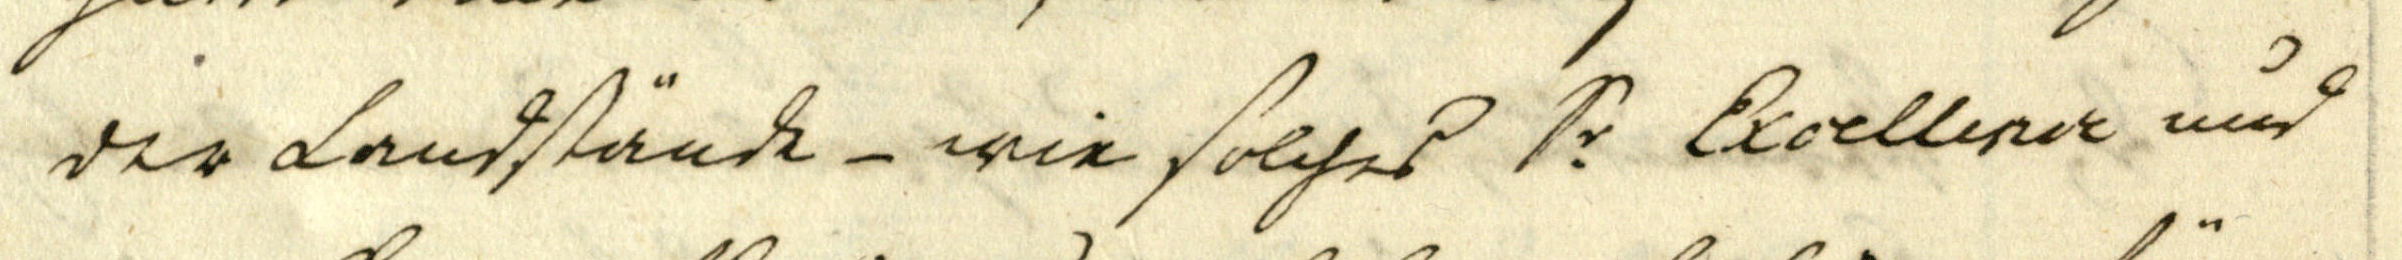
der Landstände - wie solches Sr Excellence und
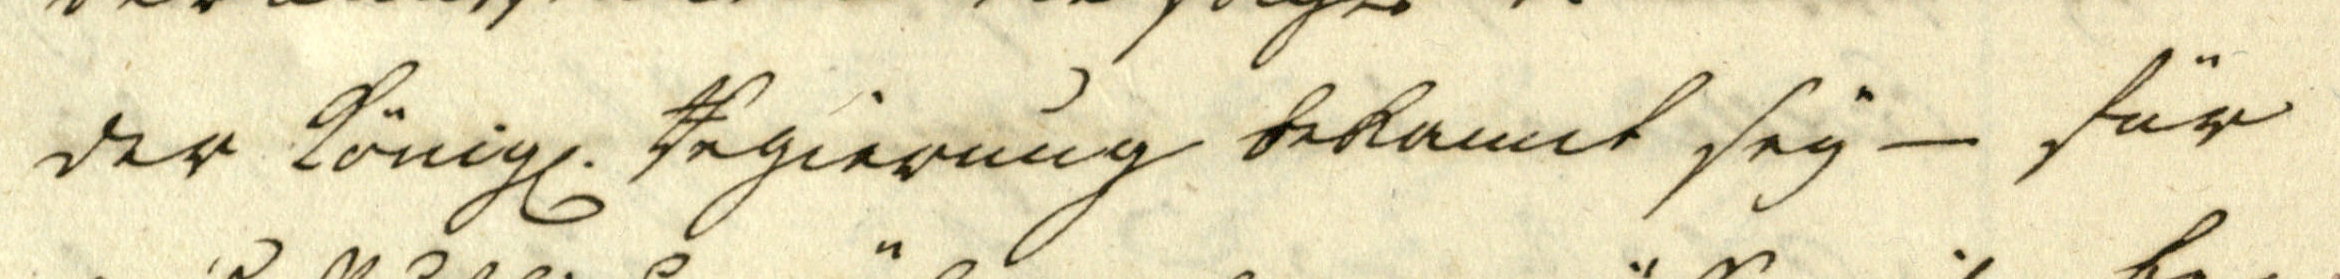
der Königl. Regierung bekannt seÿ - für
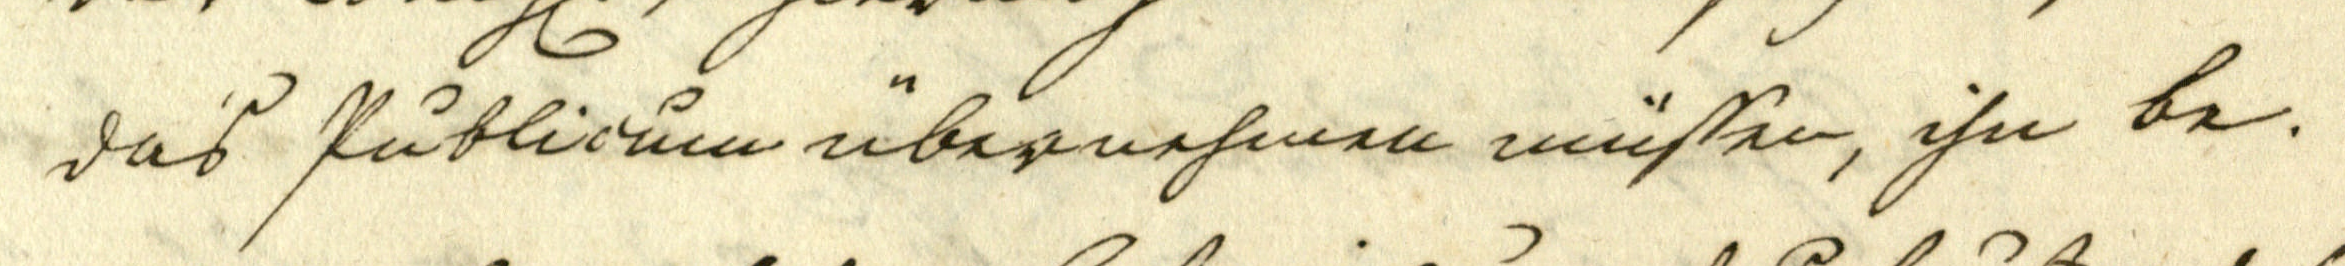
das Publicum übernehmen müssen, ihn be¬
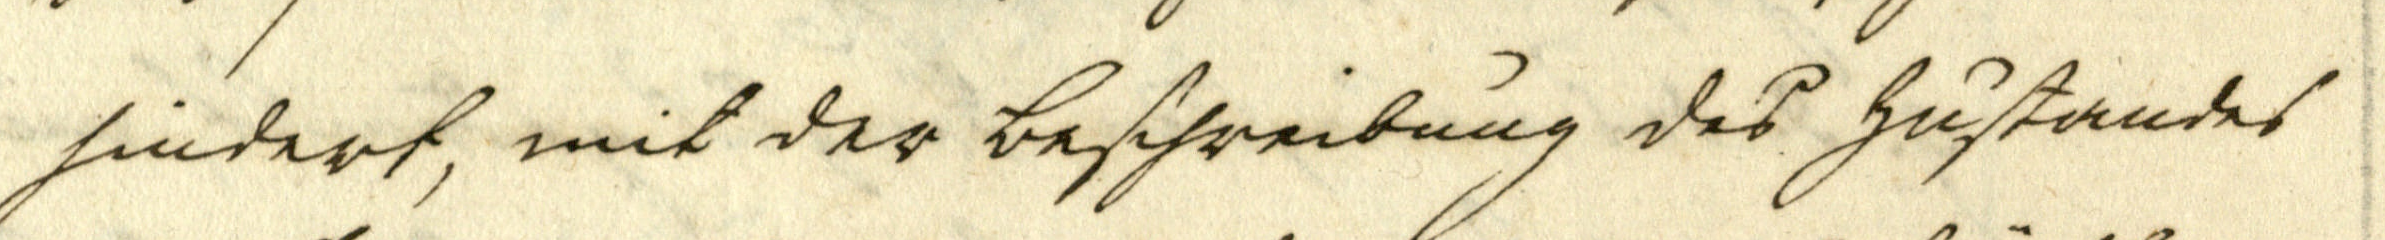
hindert, mit der Beschreibung des Zustandes
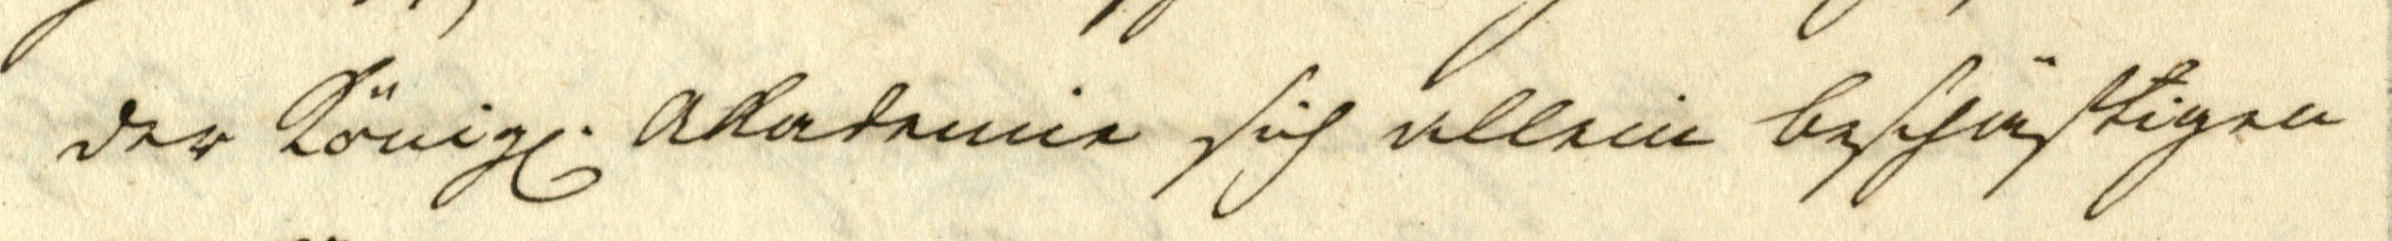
der Königl. Akademie sich allein beschäftigen
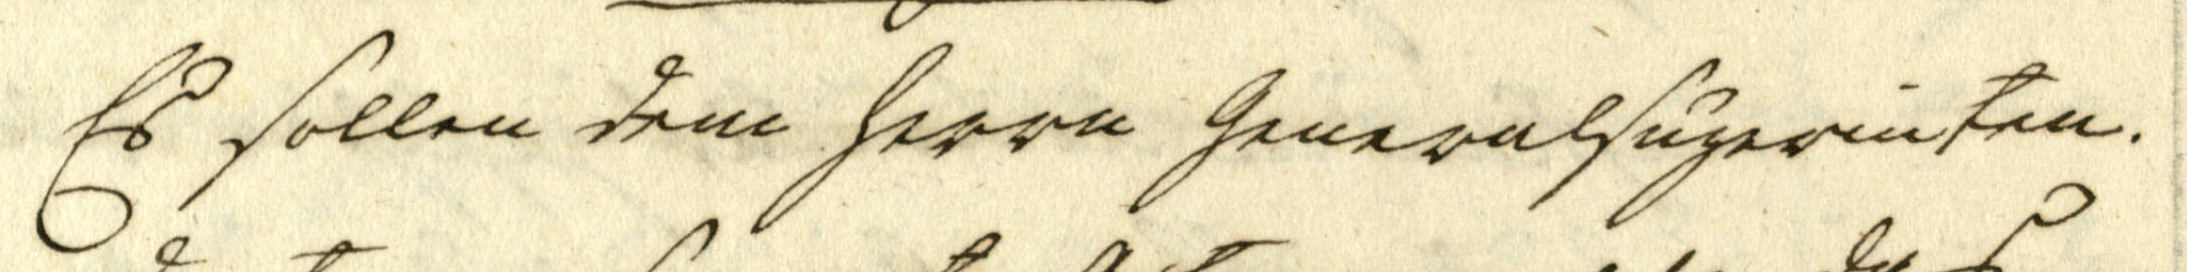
Es sollen dem Herrn Generalsuperinten¬
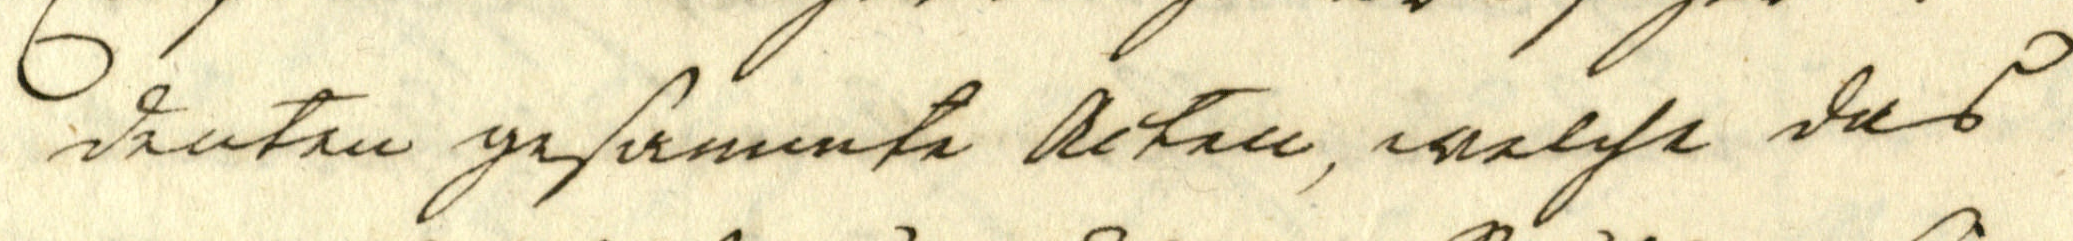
denten gesammte Acten, welche das
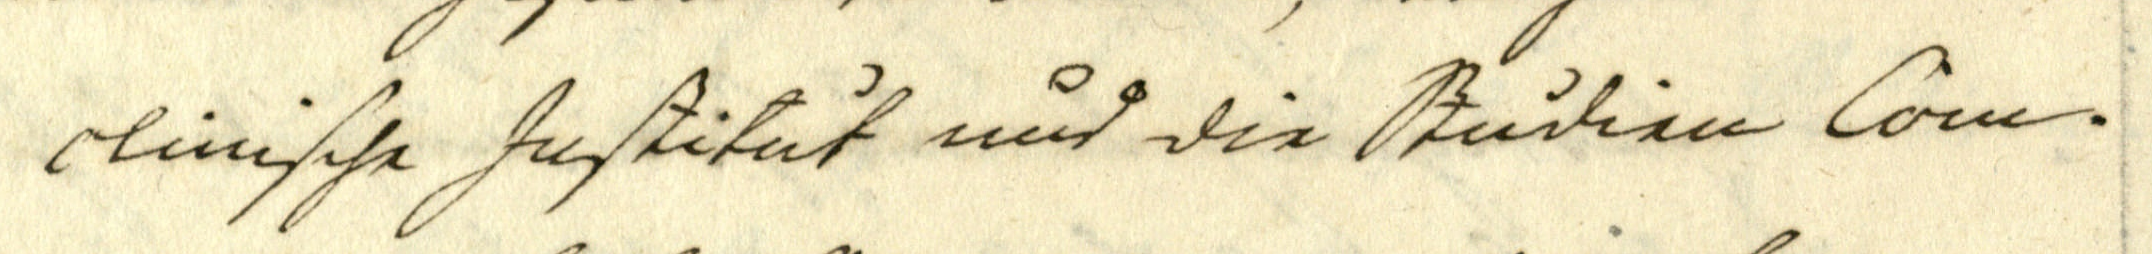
clinische Institut und die Studien Com¬
